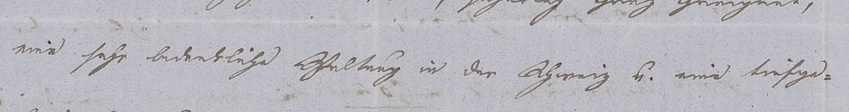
eine sehr bedenkliche Spaltung in der Schweiz u. eine tiefge-
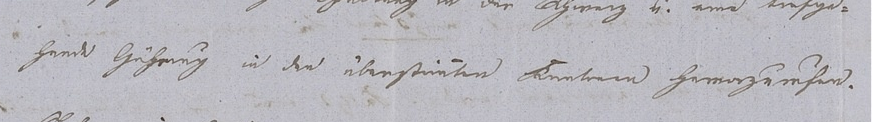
hende Gährung in den überstimmten Kantonen hervorzurufen.
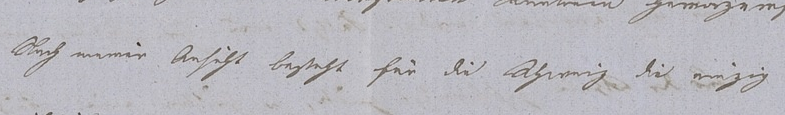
Nach meiner Ansicht besteht für die Schweiz die einzig
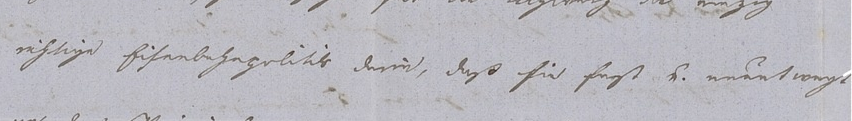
richtige Eisenbahnpolitik darin, daß sie fest und unentwegt
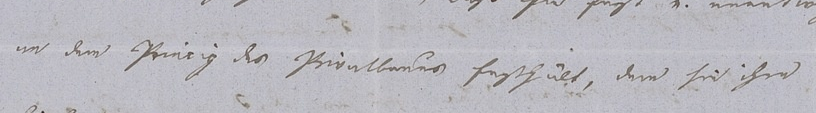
an dem Princip des Privatbaues festhält, dem sie ihre
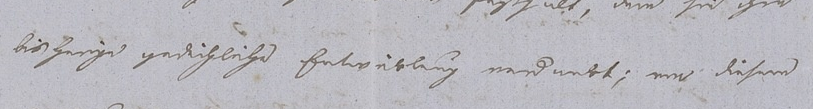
bisherige gedeihliche Entwicklung verdankt; von diesem
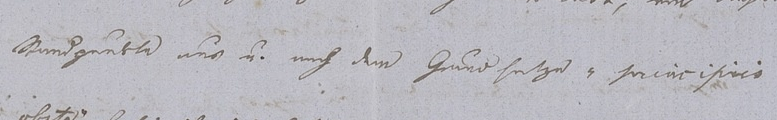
Standpunkte aus u. nach dem Grundsatze «principiis
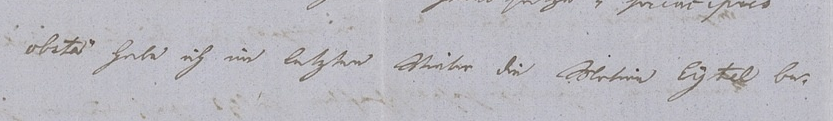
obsta» habe ich im letzten Winter die Motion Eytel be-
